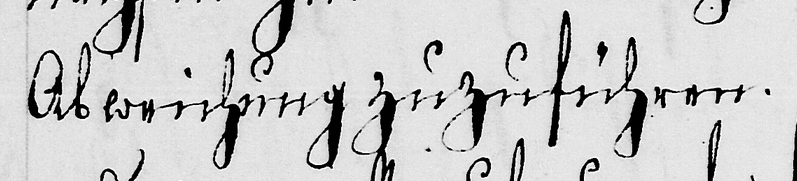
Abweichung zuzuführen.
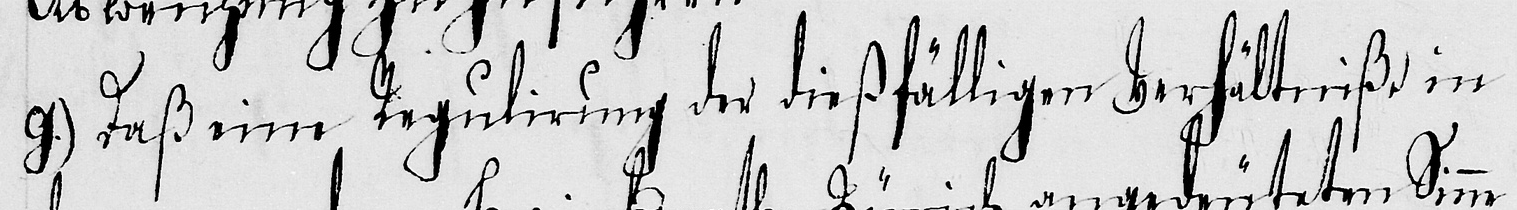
g.) Daß eine Regulirung der dießfälligen Verhältniße in
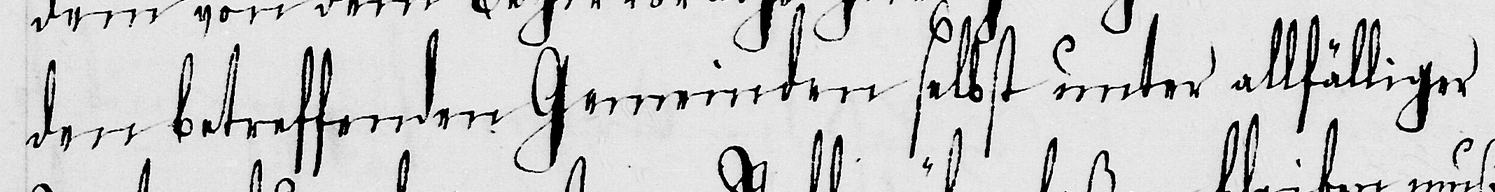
den betreffenden Gemeinden selbst unter allfälliger
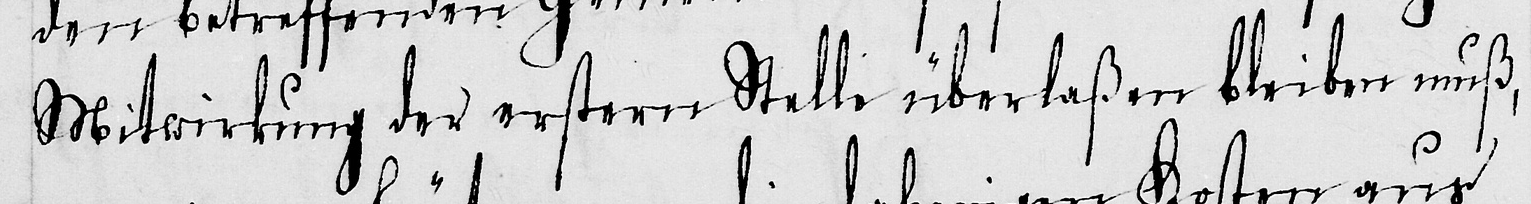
Mitwirkung der ersten Stelle überlaßen bleiben muß,
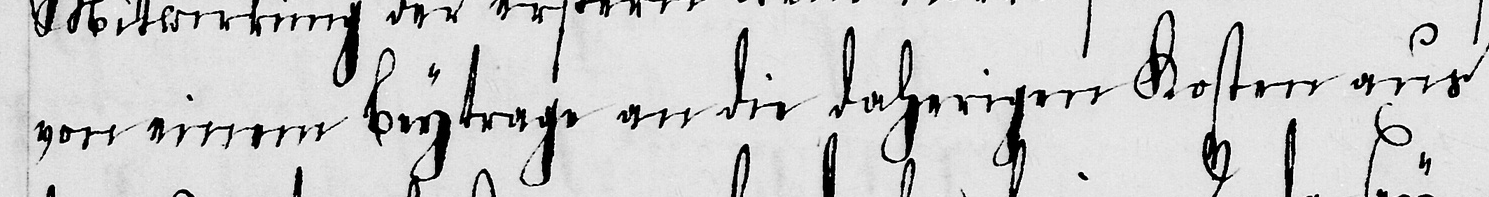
von einem Beytrage an die daherigen Kosten aus
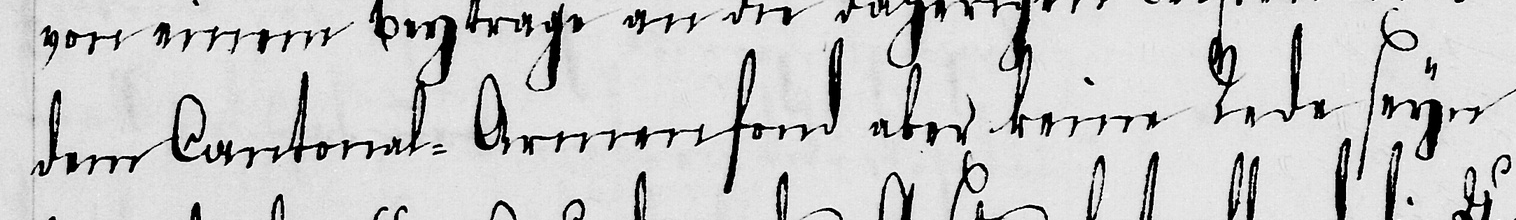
dem Cantonal-Armenfond aber keine Rede seyn
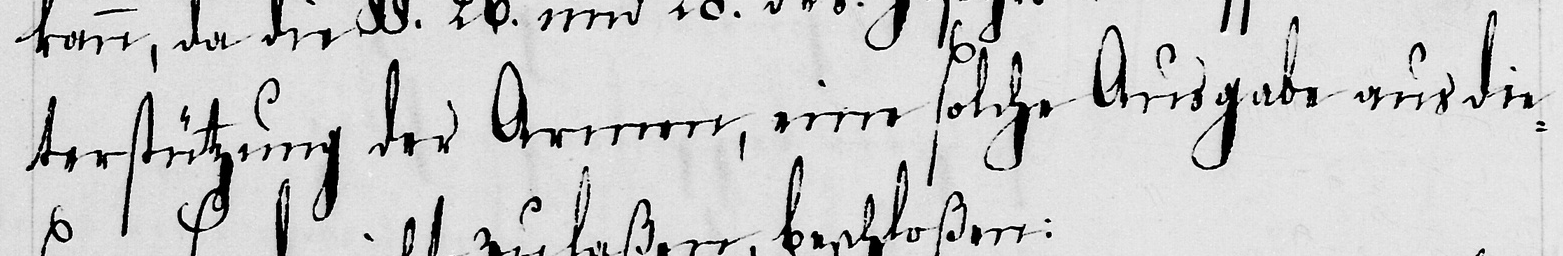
nterstützung der Armen, eine solche Ausgabe aus die¬
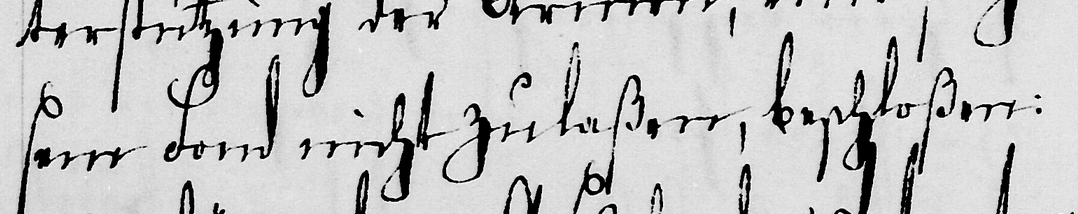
sen Fond nicht zulaßen, beschloßen:
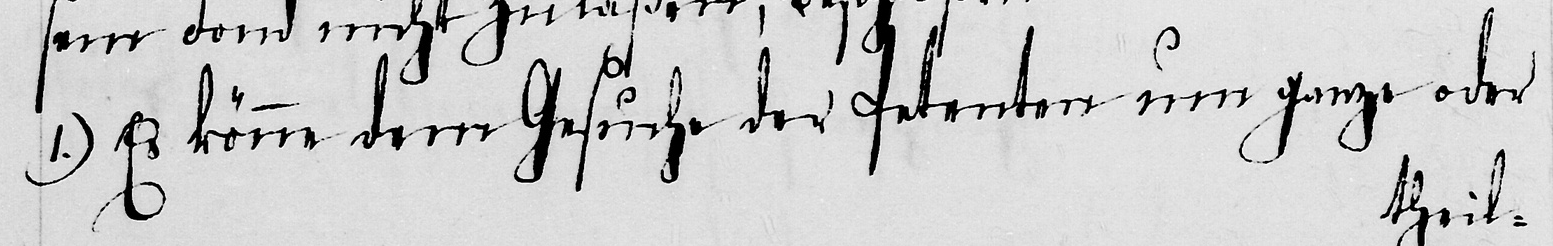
1.) Es könne dem Gesuche der Petenten um ganze oder
